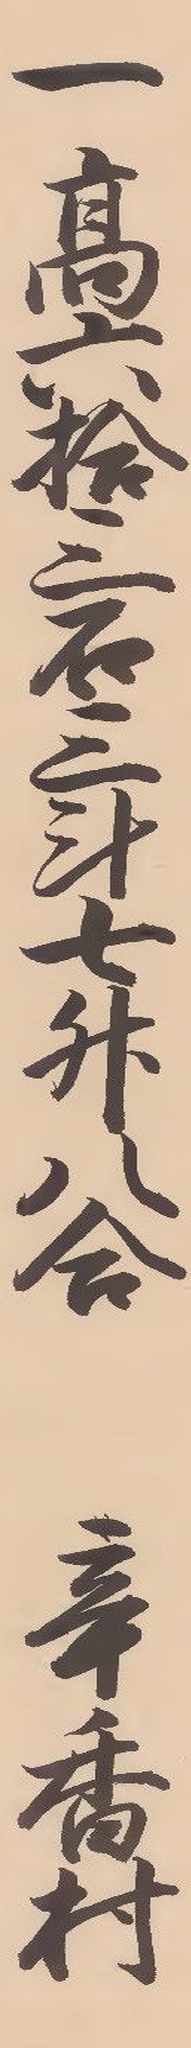一髙六拾三石三斗七升八合辛香村
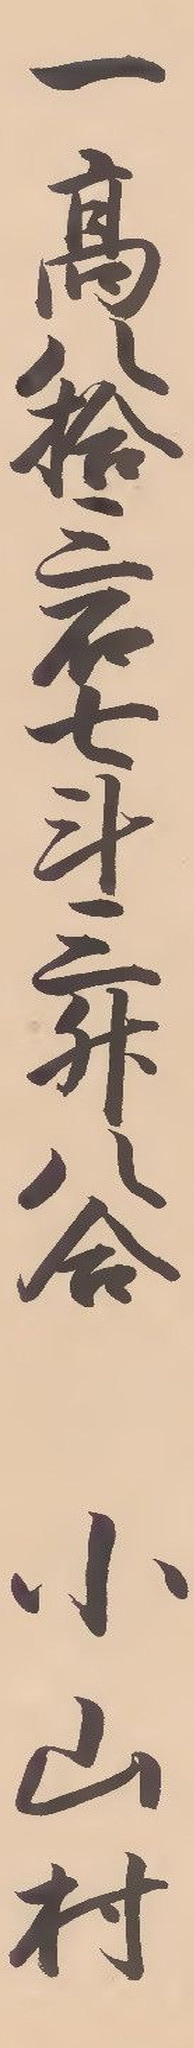一髙八拾三石七斗三升八合小山村

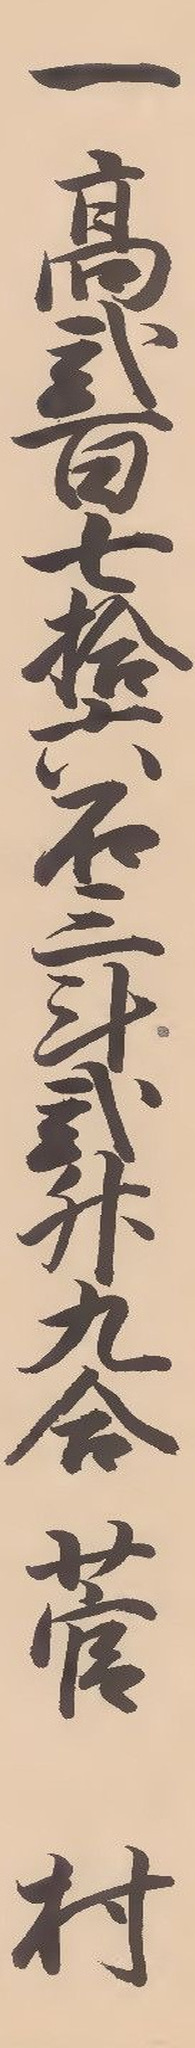一髙弐百七拾六石三斗弐升九合菅村
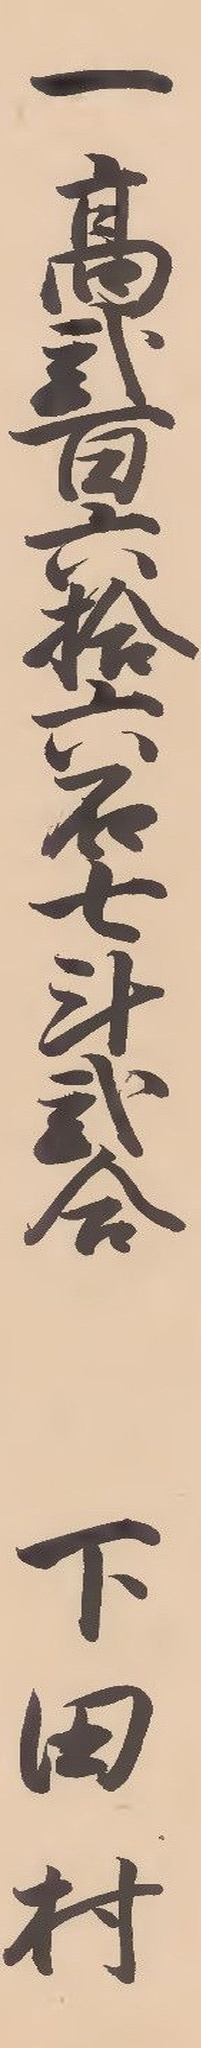一髙弐百六拾六石七斗弐合下田村
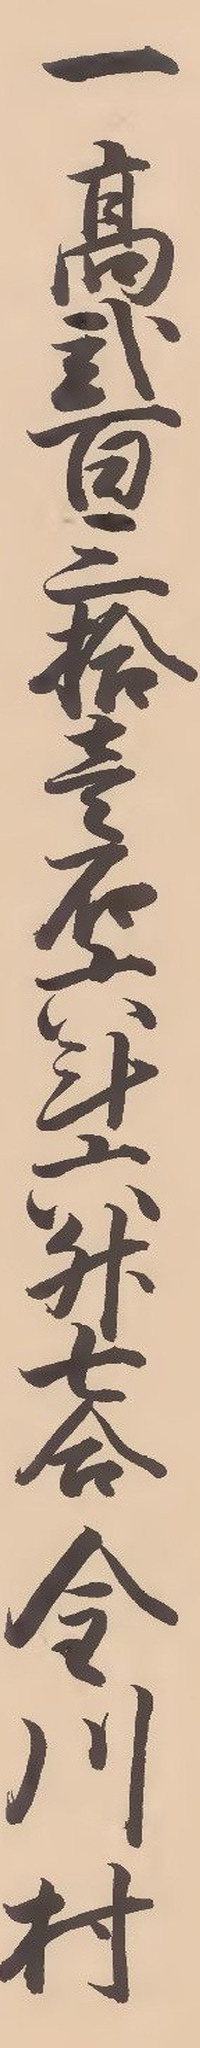一髙弐百三拾壱石六斗六升七合金川村
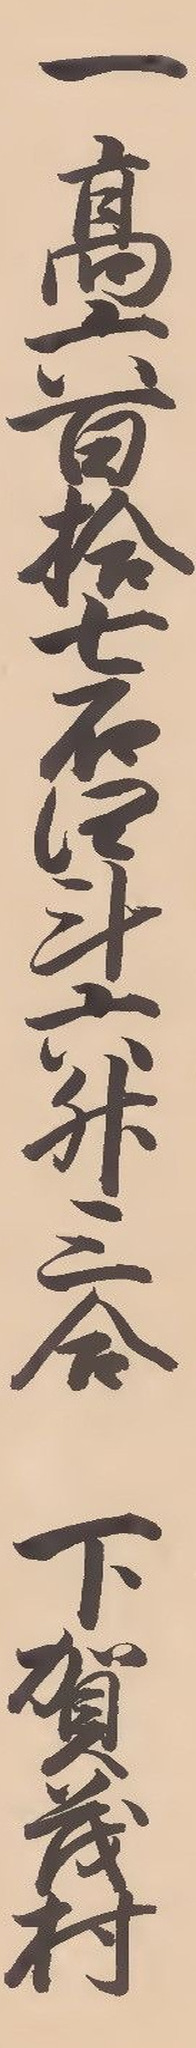一髙六百拾七石四斗六升三合下賀茂村
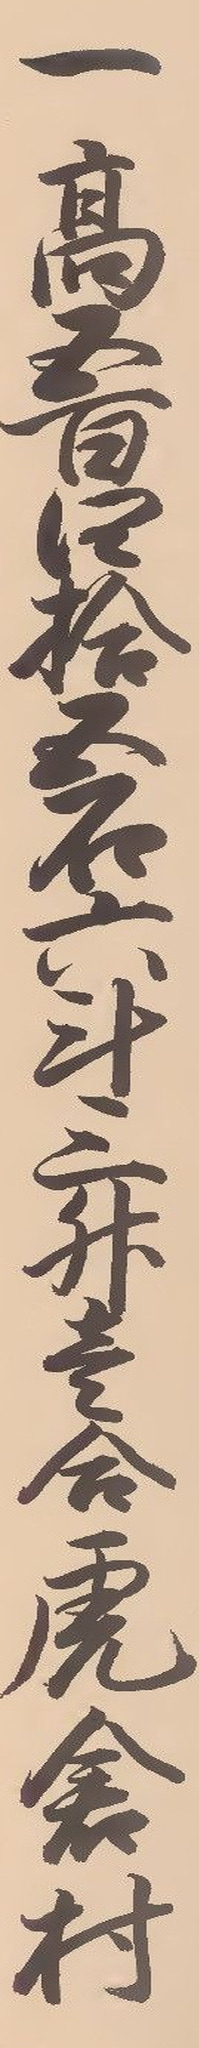一髙五百四拾五石六斗三升壱合虎倉村
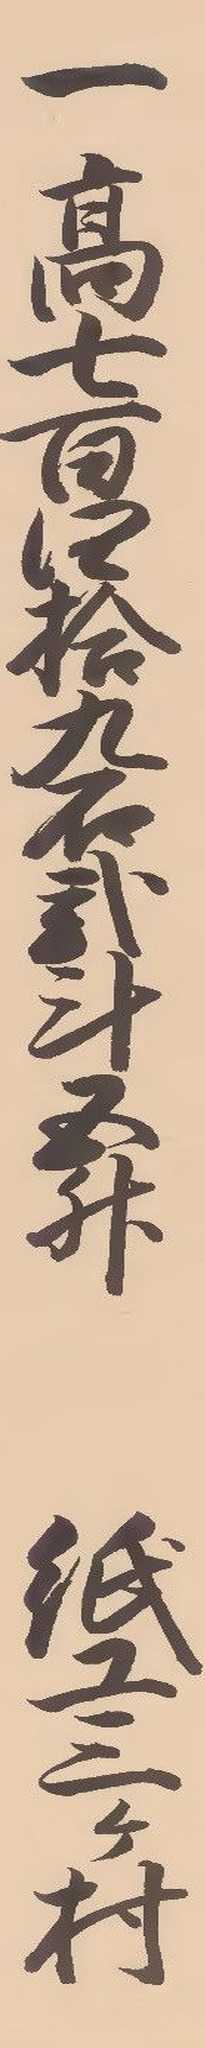一髙七百四拾九石弐斗五升紙工三ケ村
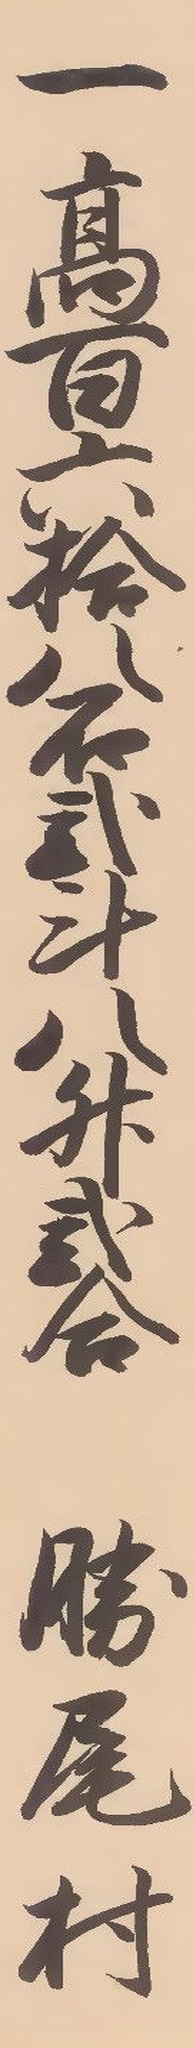一髙百六拾八石弐斗八升弐合勝尾村
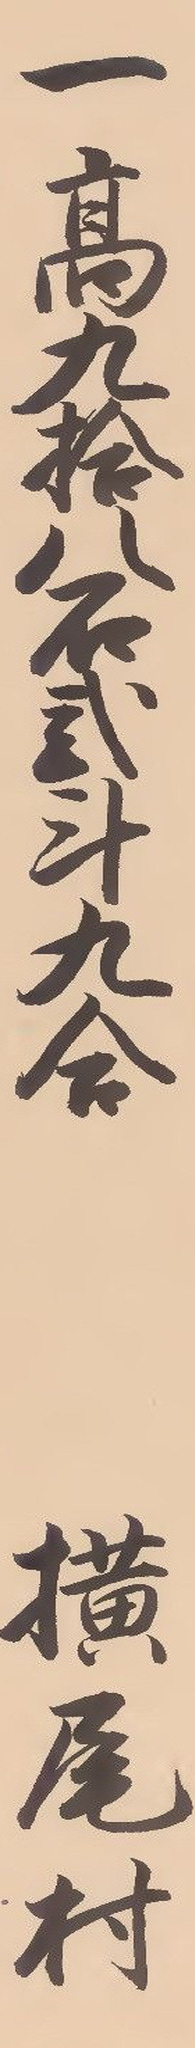一髙九拾八石弐斗九合横尾村

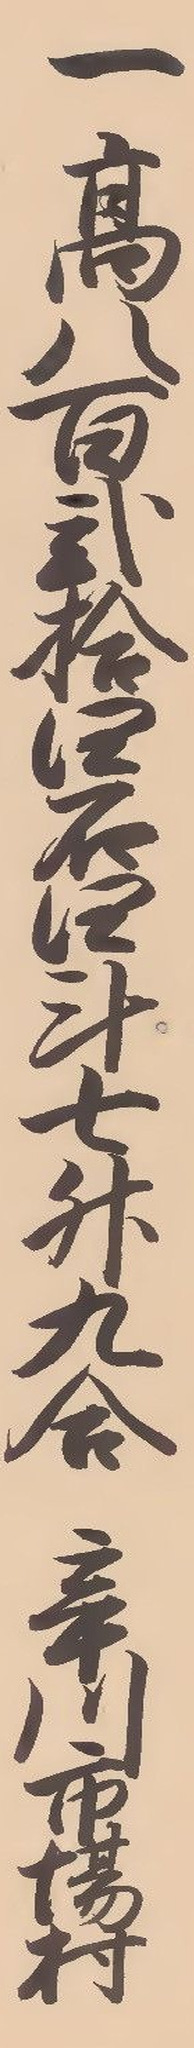一髙八百弐拾四石四斗七升九合辛川市場村
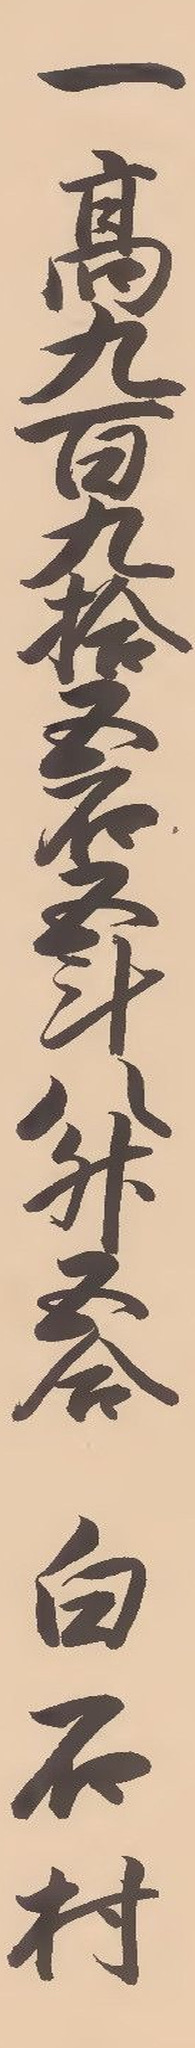一髙九百九拾五石五斗八升五合白石村
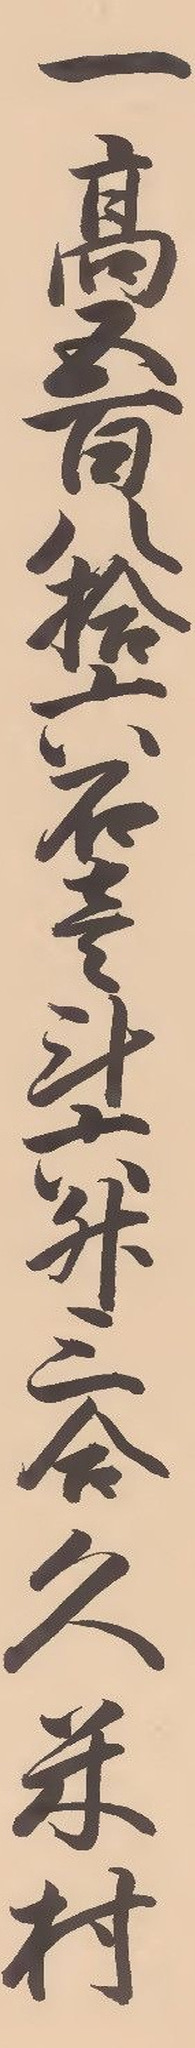一髙五百八拾六石壱斗六升三合久米村
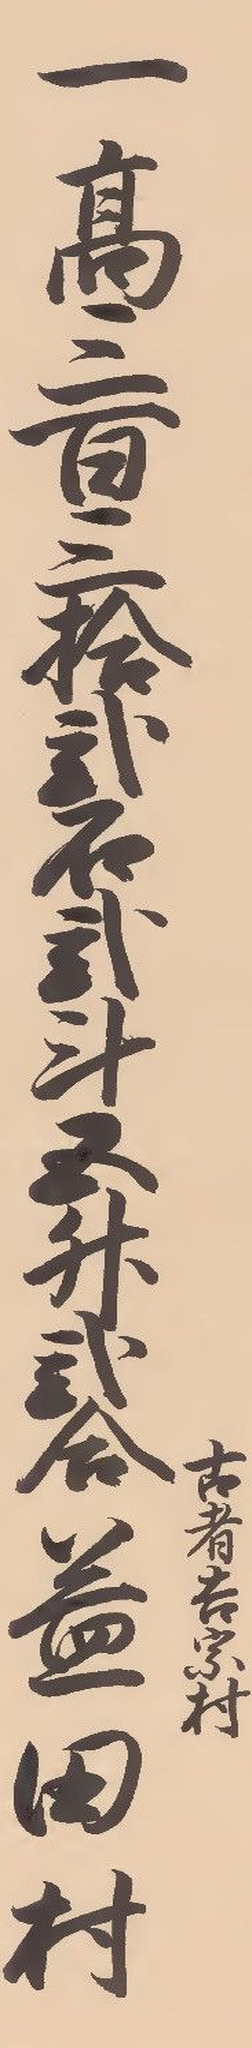一髙三百三拾弐石弐斗五升弐合益田村
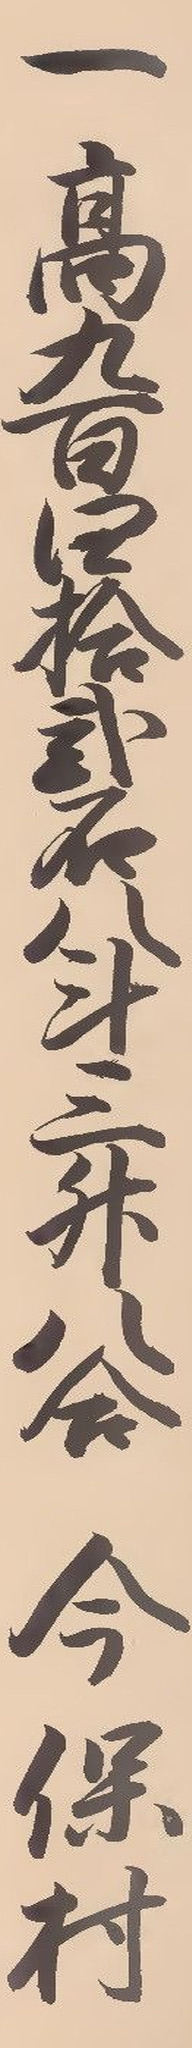一髙九百四拾弐石八斗三升八合今保村
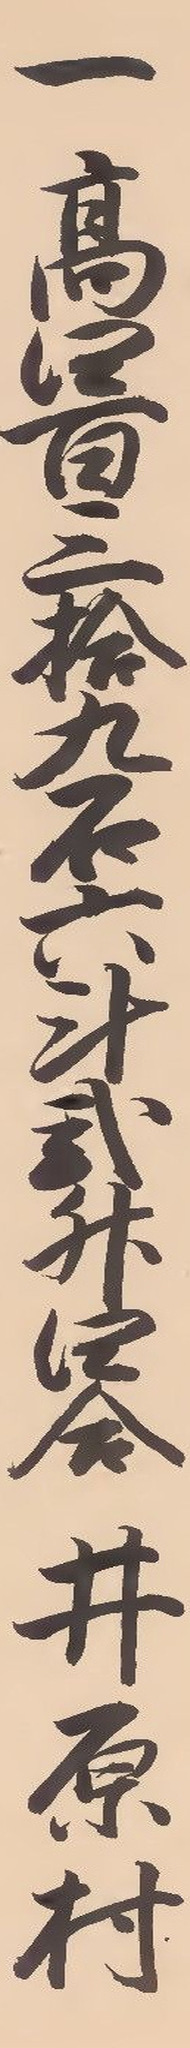一髙四百三拾九石六斗弐升四合井原村
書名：備前国郷帳
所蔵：国立公文書館 National Archives of Japan
